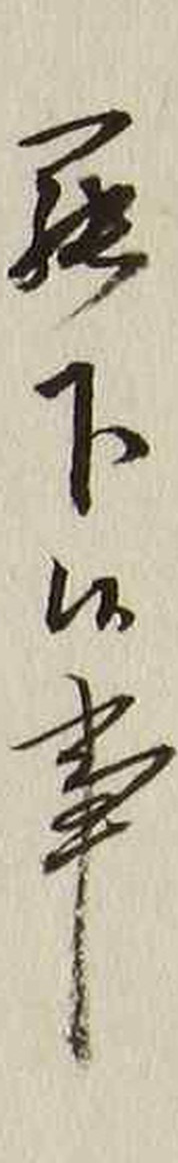罷下候事
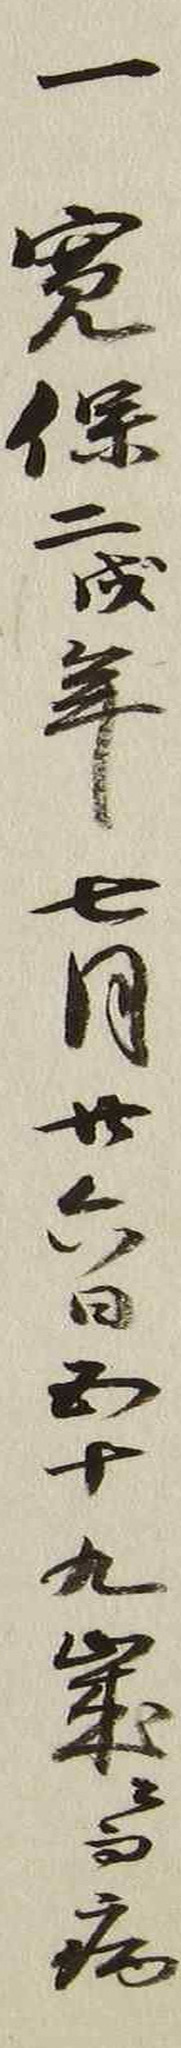一寛保二戌年七月廿六日五十九歳ニ而病
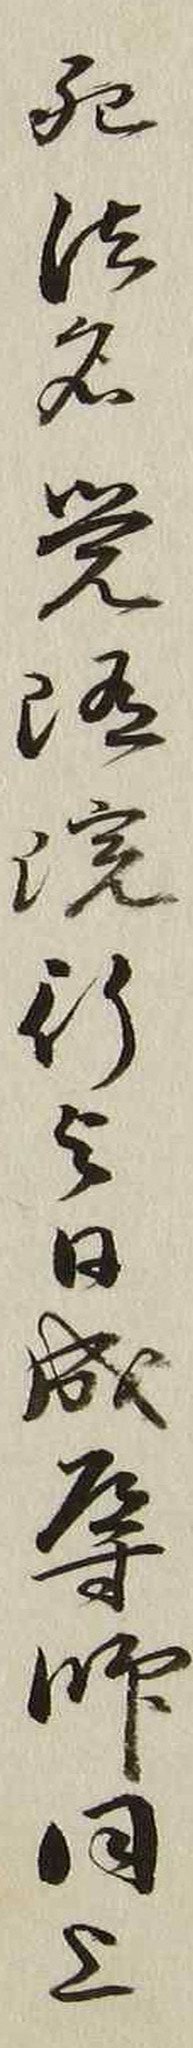死法名覚隋院行与日成導師同上
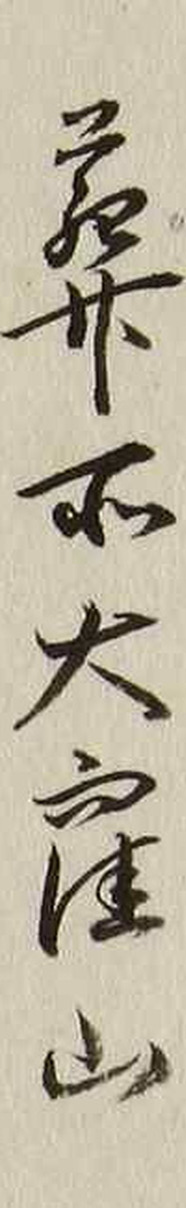葬所大窪山
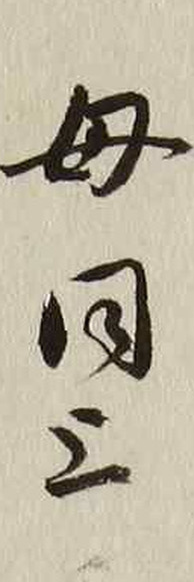母同上
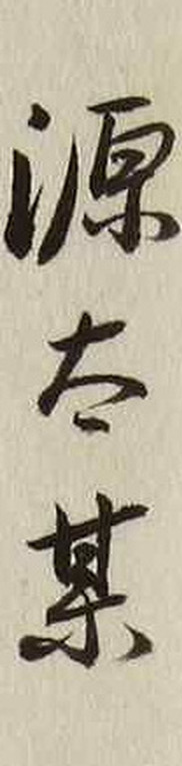源太某
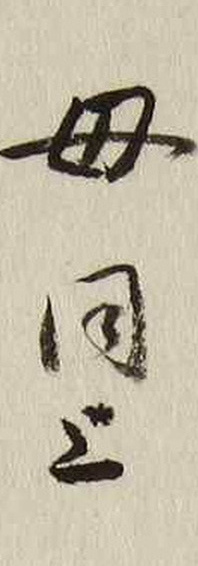母同上
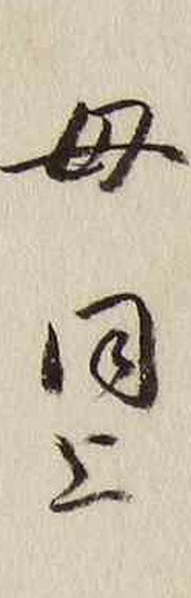母同上

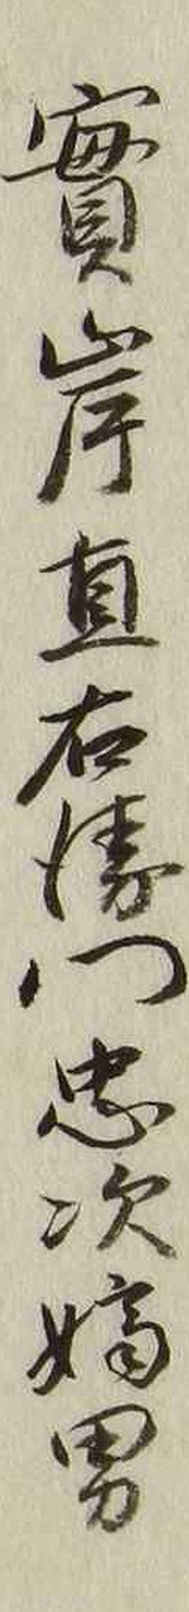実岸直右衛門忠次嫡男
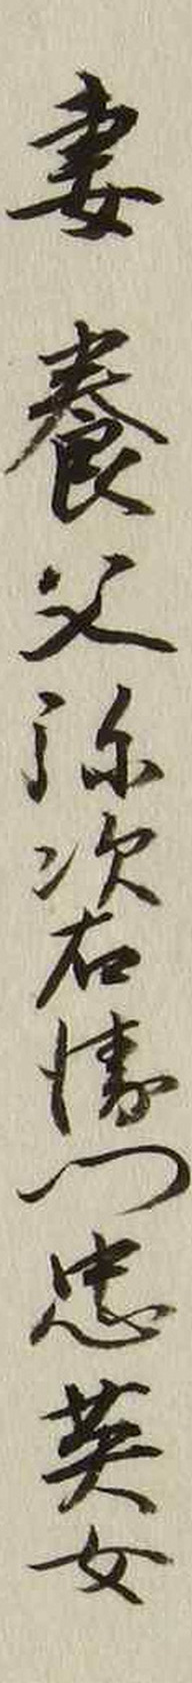妻養父弥次右衛門忠英女
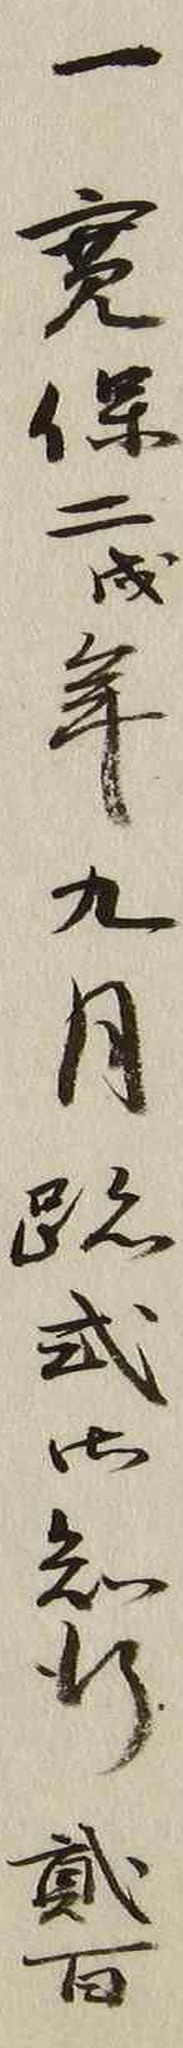一寛保二戌年九月跡式御知行弐百
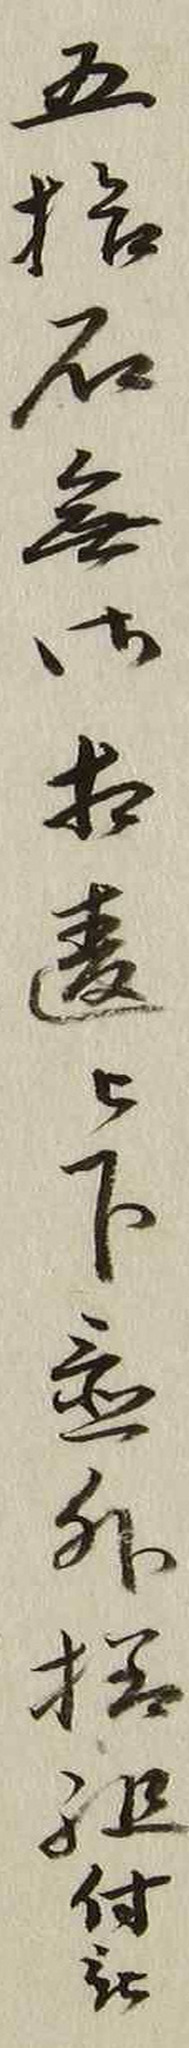五拾石無御相違被下置外様組付被
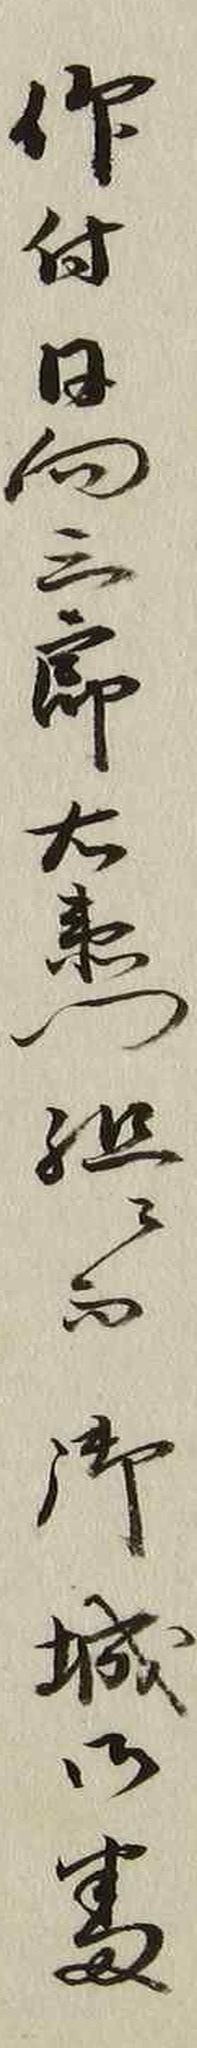仰付日向三郎右衛門組ニ而御城御番
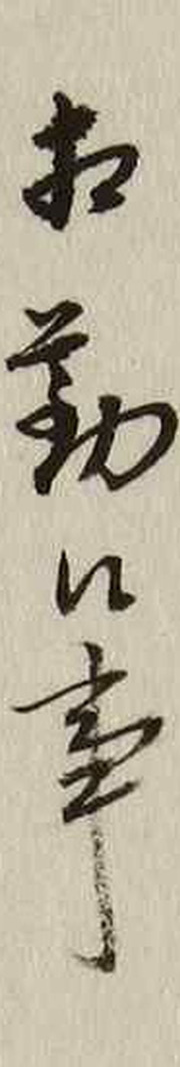相勤候事
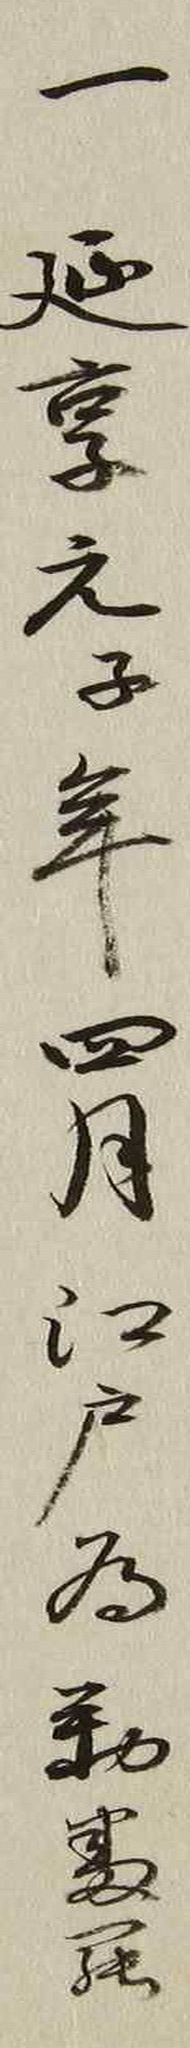一延享元子年四月江戸為勤番罷
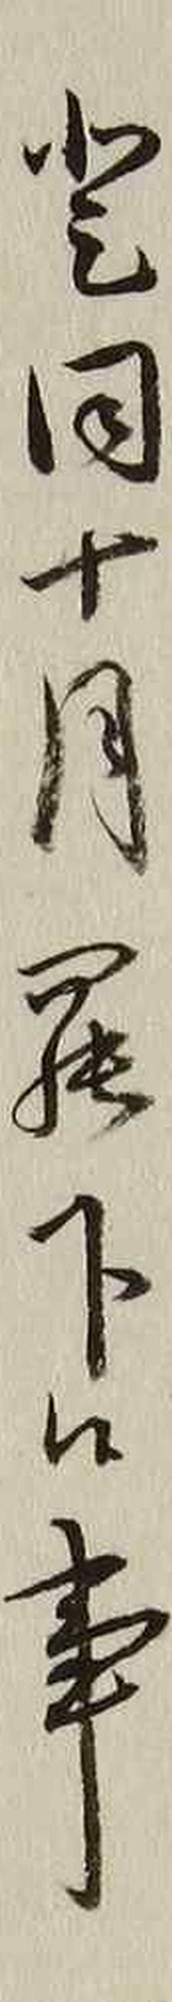登同十月罷下候事
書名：諸士系譜　巻之160　な之部2
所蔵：会津若松市立会津図書館
